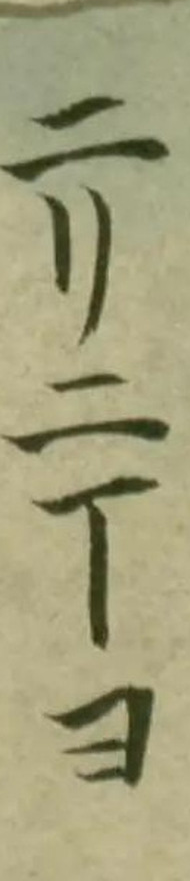二リ二丁ヨ
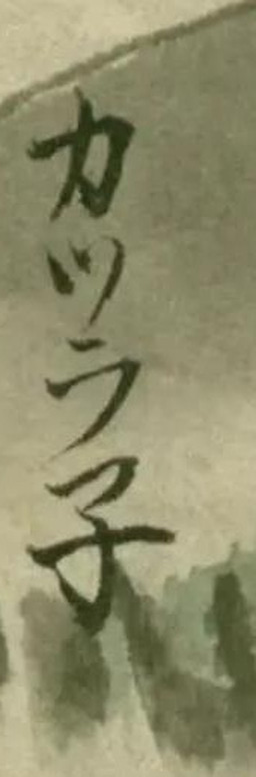カツラネ
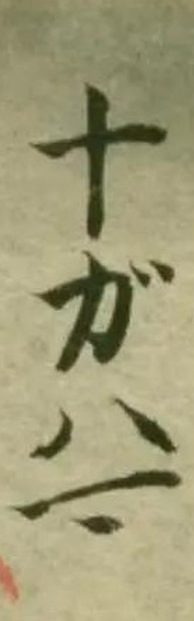ナガハマ
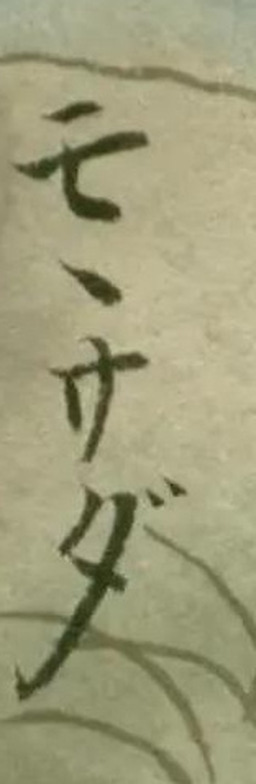モヽサダ
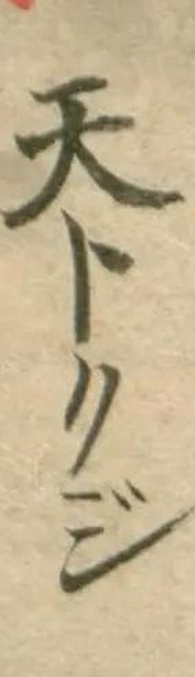天トクジ

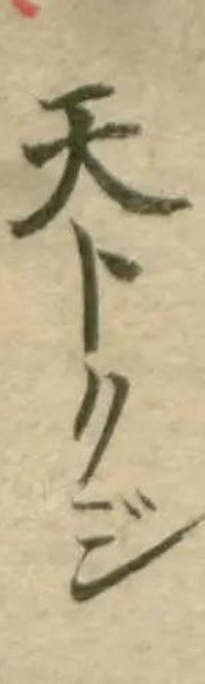天トクジ
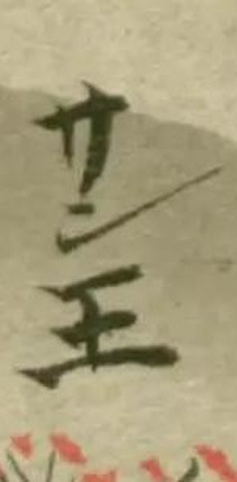サン王
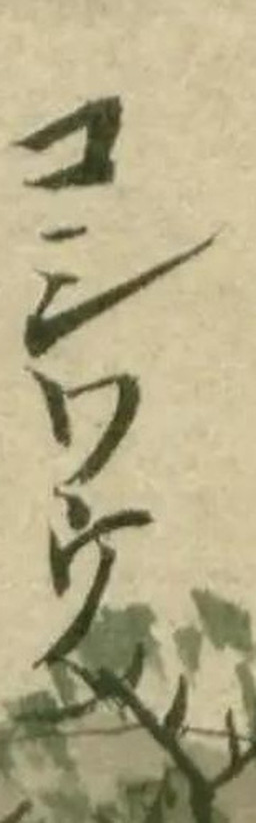コシワウ
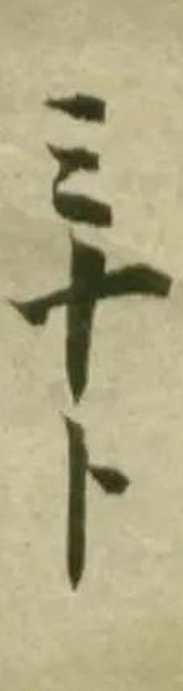ミナト
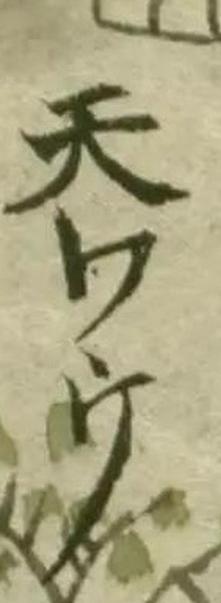天ワウ
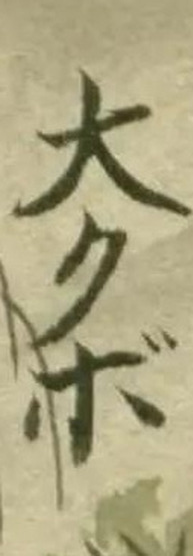大クボ
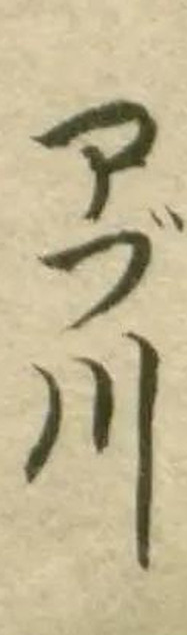アブ川
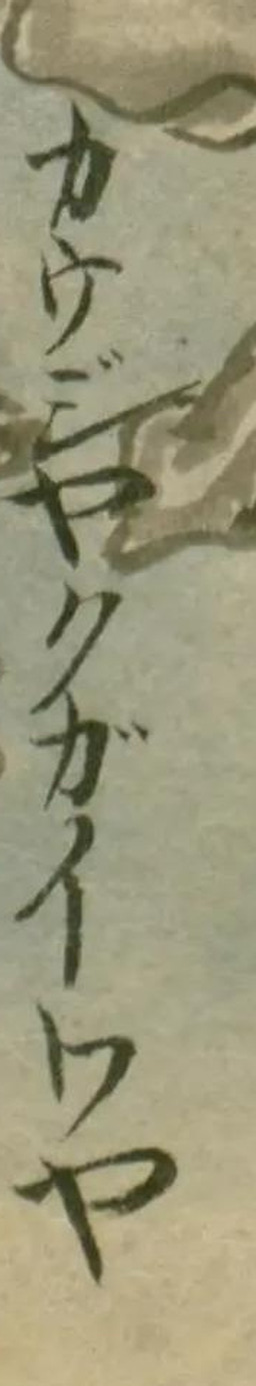カウジヤクガイワヤ
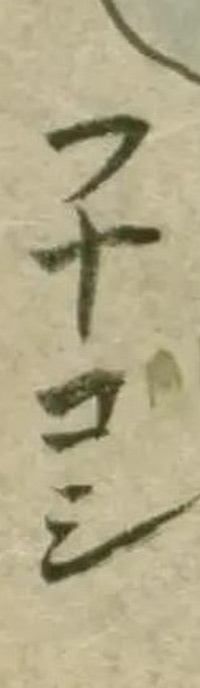フナゴシ
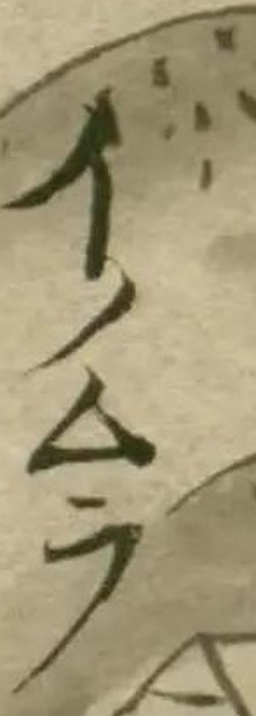イノムラ
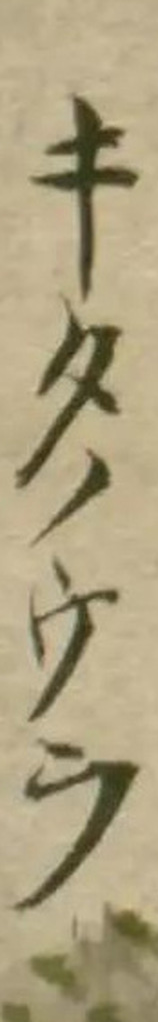キタノウラ
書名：江戸より奥州津輕迄道筋之圖
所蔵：国立国会図書館 National Diet Library, JAPAN
